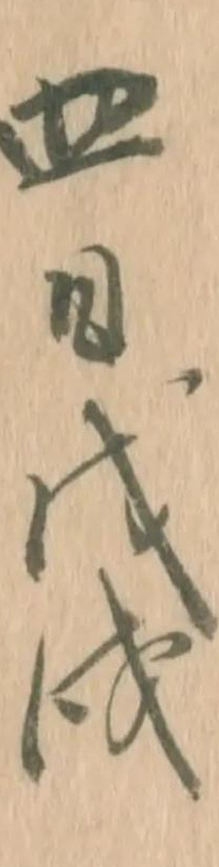四日戊戌
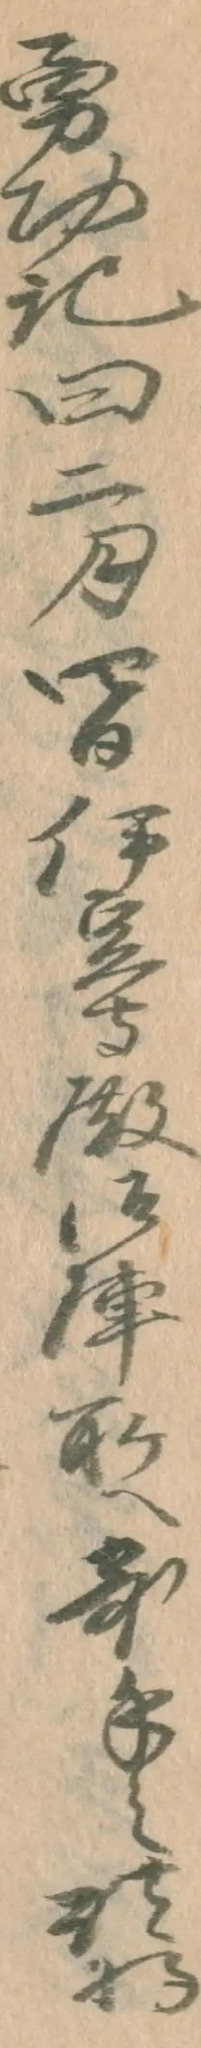勇功記曰二月四日伊豆守殿御陣所へ寄手之諸将
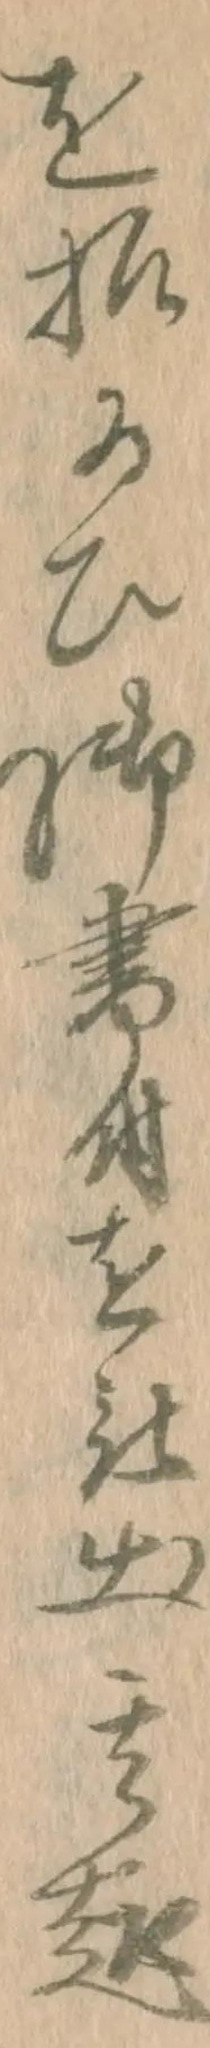を招ゐひ御書付を仕出其趣
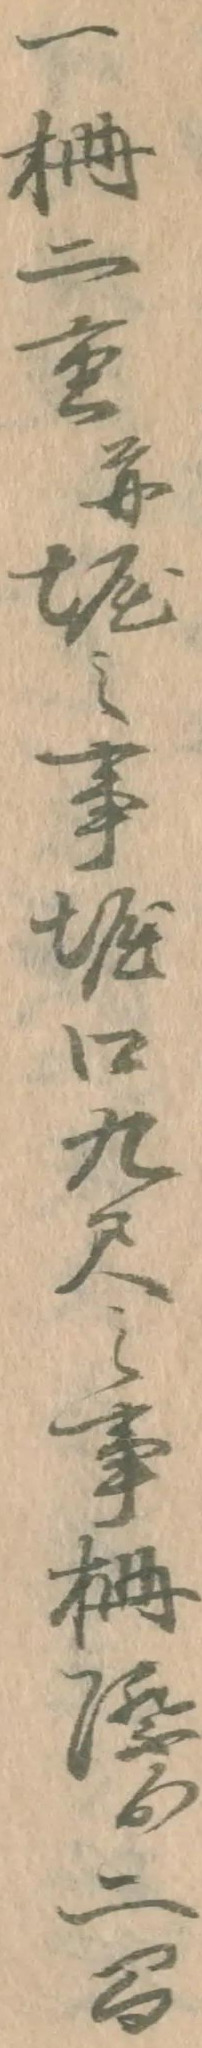一柵二重幷堀之事堀口九尺之事柵際ゟ二間
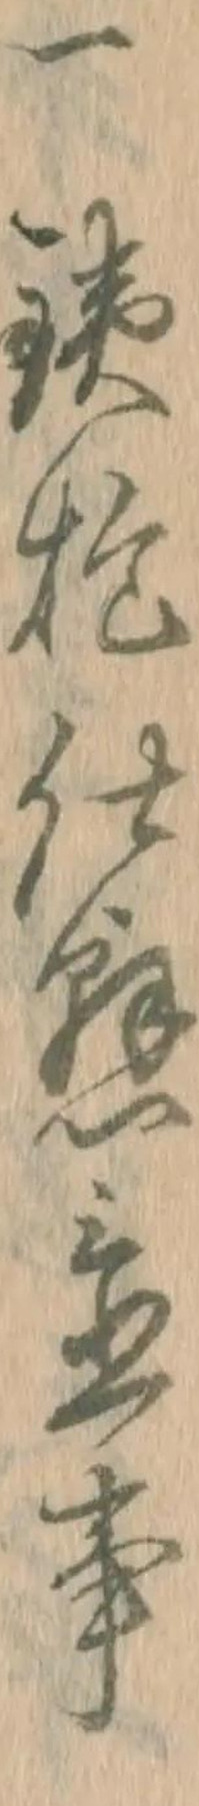一鉄炮仕懸置事
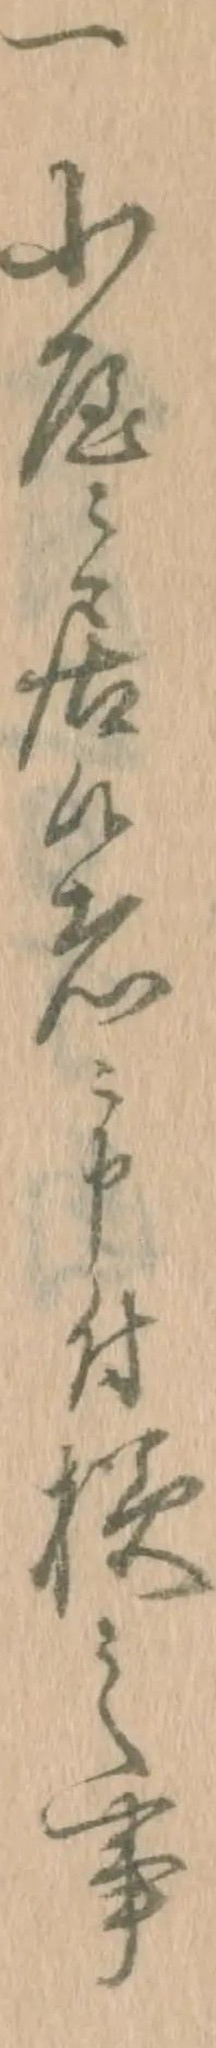一小屋に居候者に申付様之事
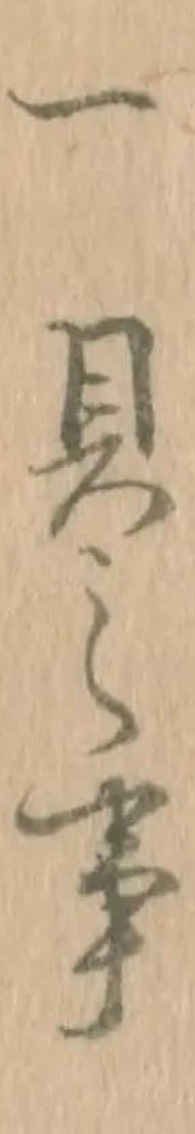一貝之事
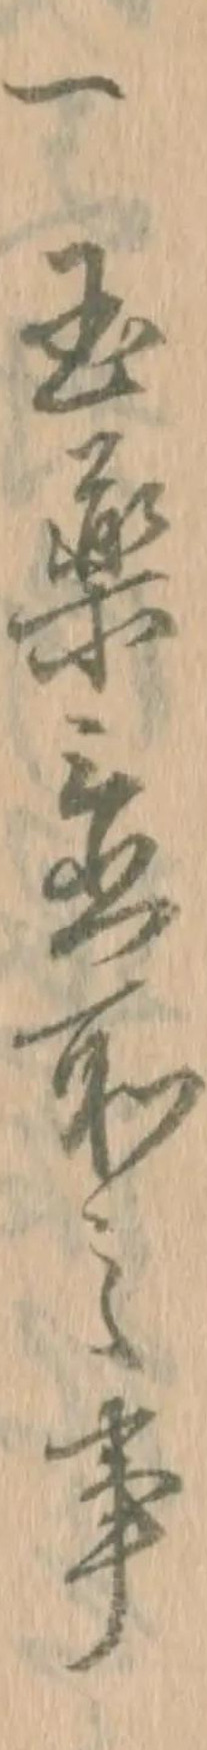一玉薬置取之事
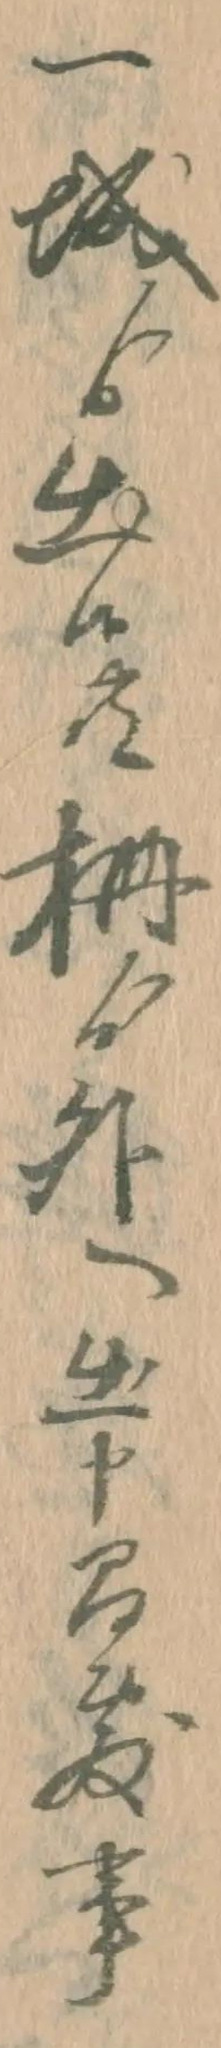一城ゟ出候共柵ゟ外へ出申間敷事
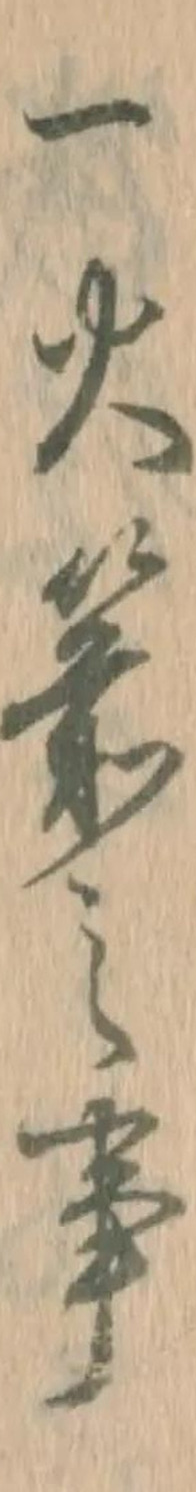一火箭之事
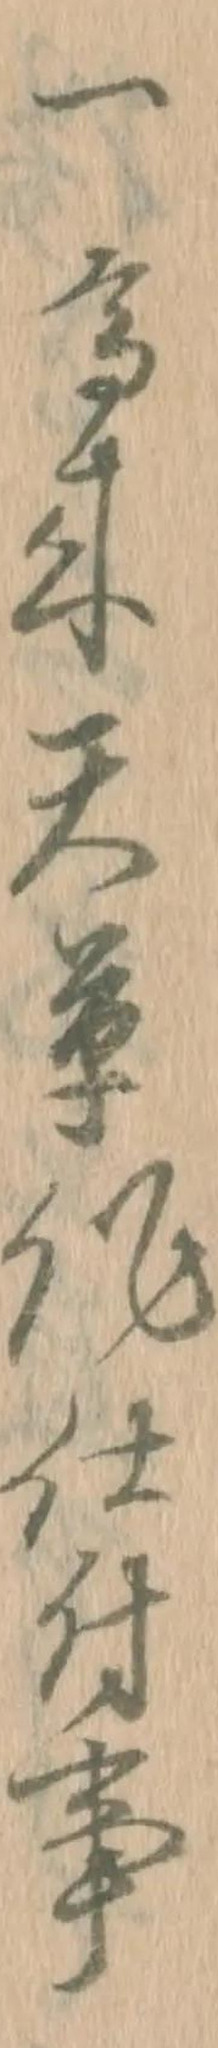一高来天草作仕付事
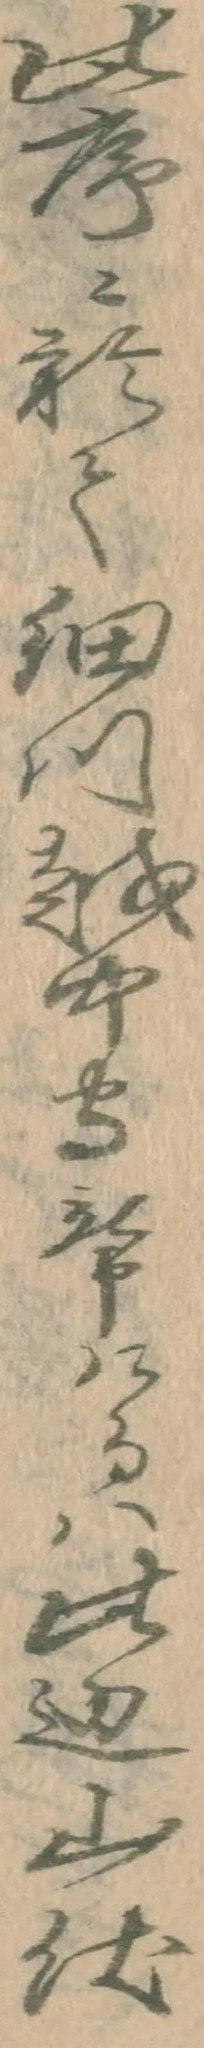此序に於て細川越中守被申けるは此辺山伏
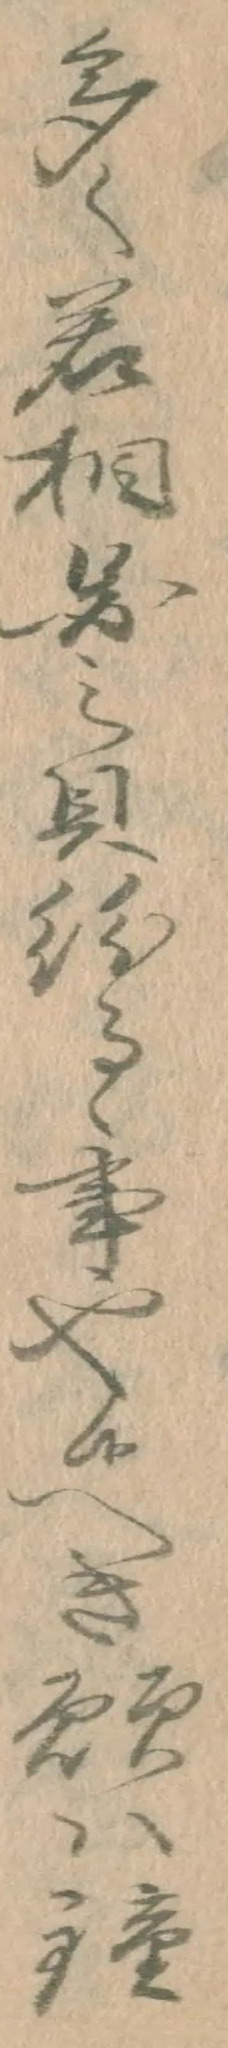多く若相図之貝紛るゝ事や候へき願は鐘
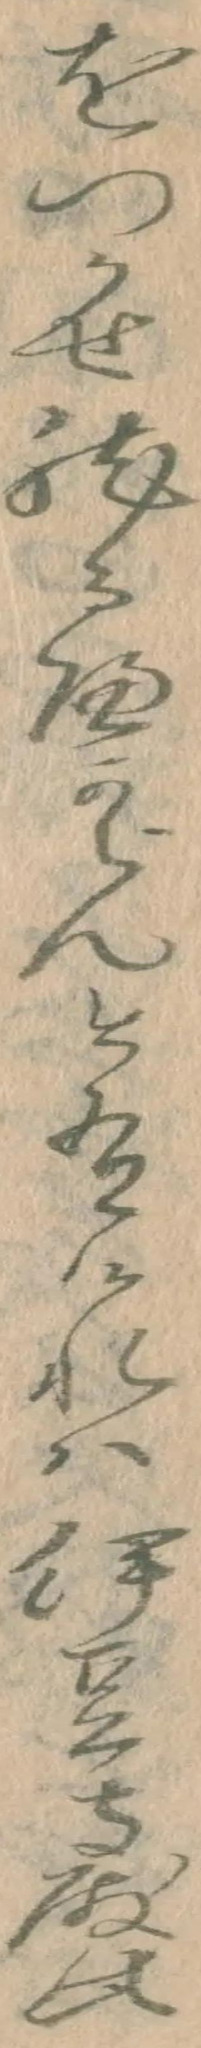をつかせ然る扁からんと有けれは伊豆守殿此
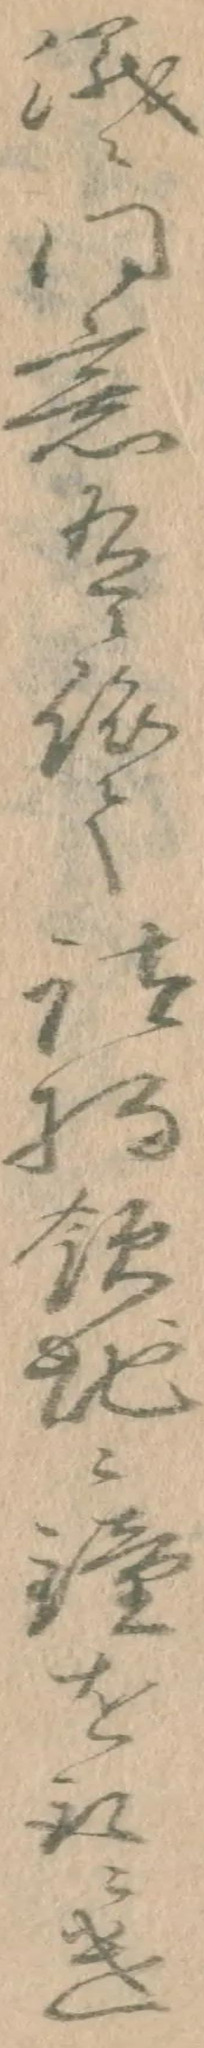儀に同意有に依て諸将領地に鐘を取に遣
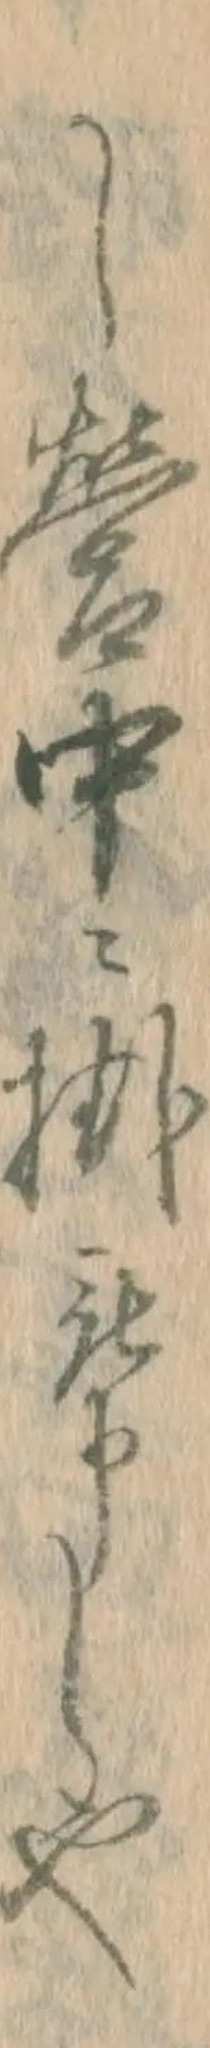し営中に掛被申し也
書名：切支丹御退治記 49巻. [6]
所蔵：国立国会図書館 National Diet Library, JAPAN
